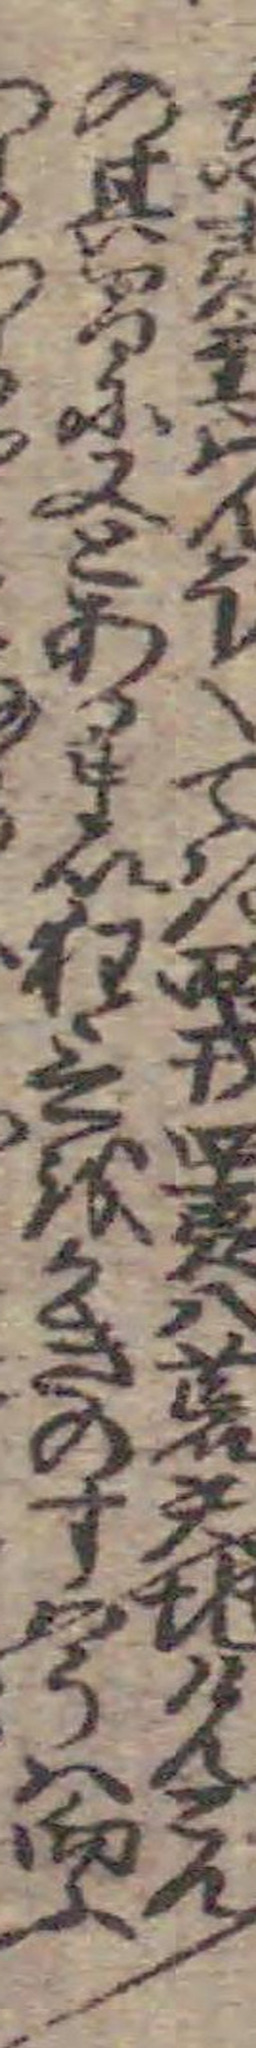の其間に又とあるまい狂言をかきのすわうは向ふ
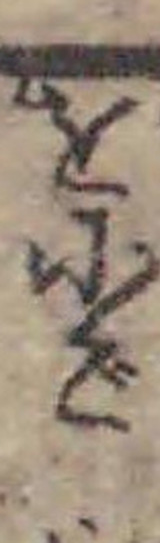をにご
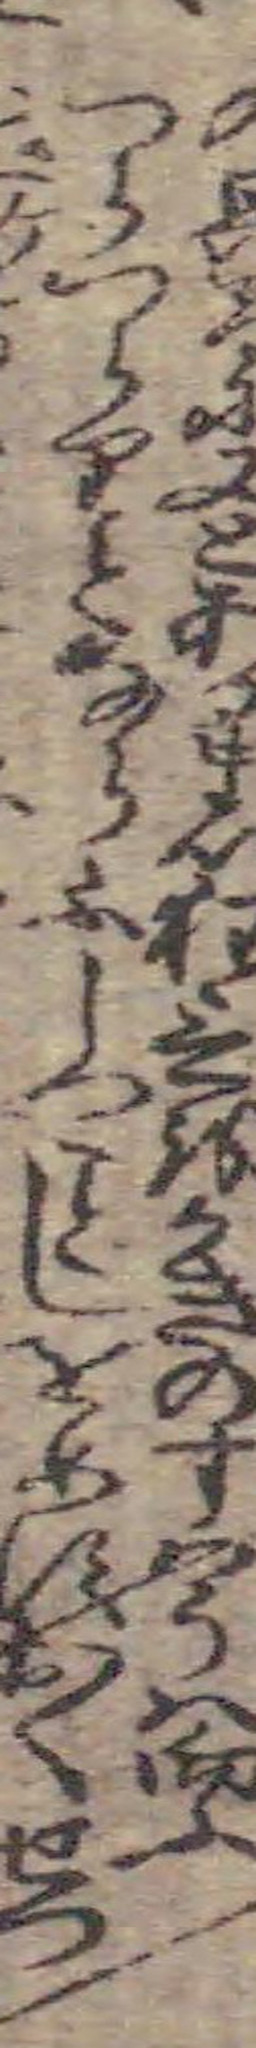つらつらりとならふしつことしをめすおくせつ
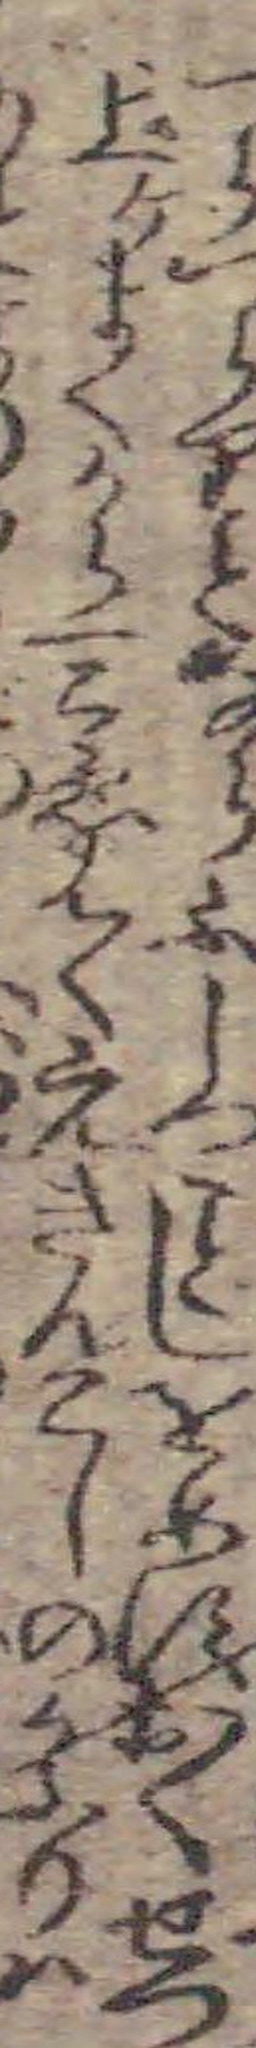上けまくから一こゑはくえきんこしのかふりは
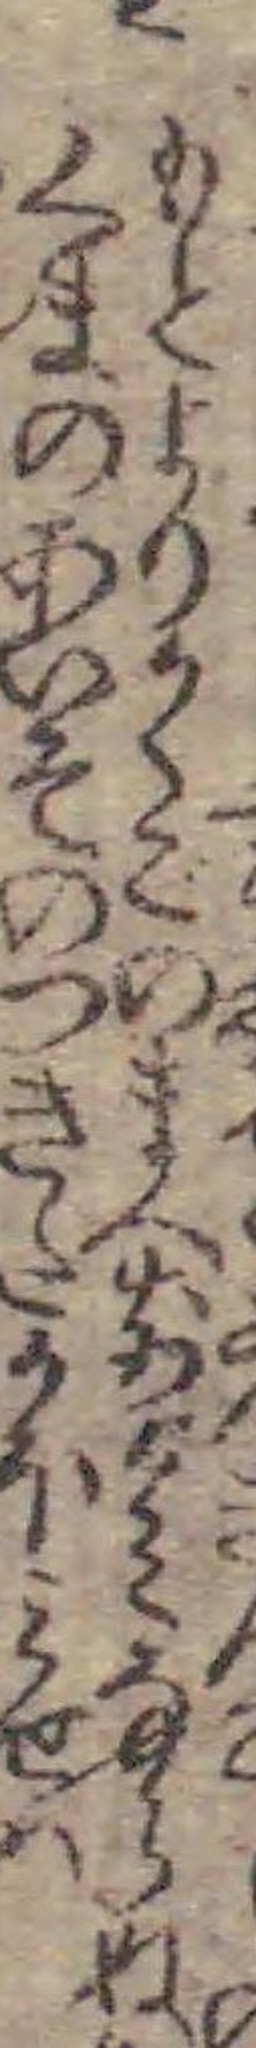くまのあいそのつきたかほみせは
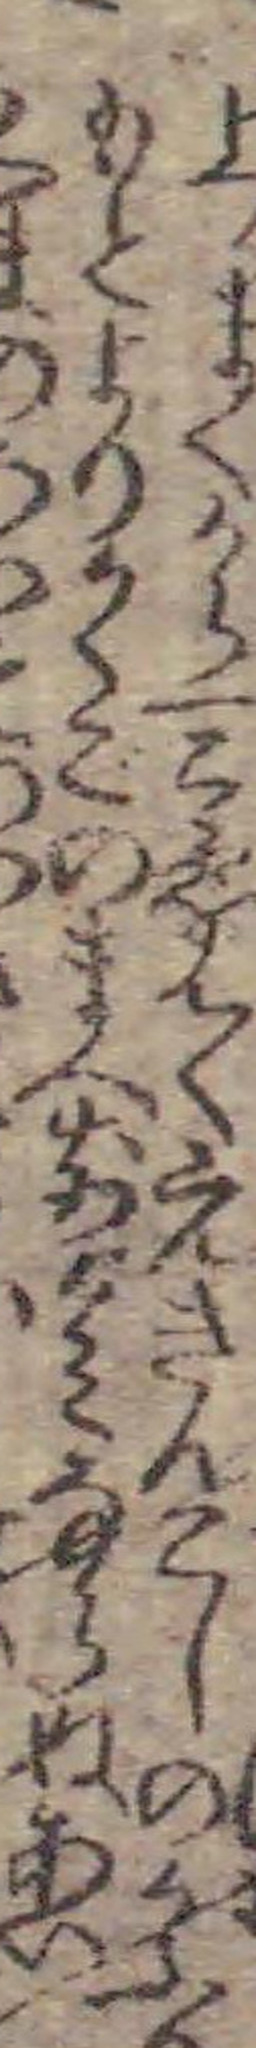もとよりかくごのまへ前がみならぬあい
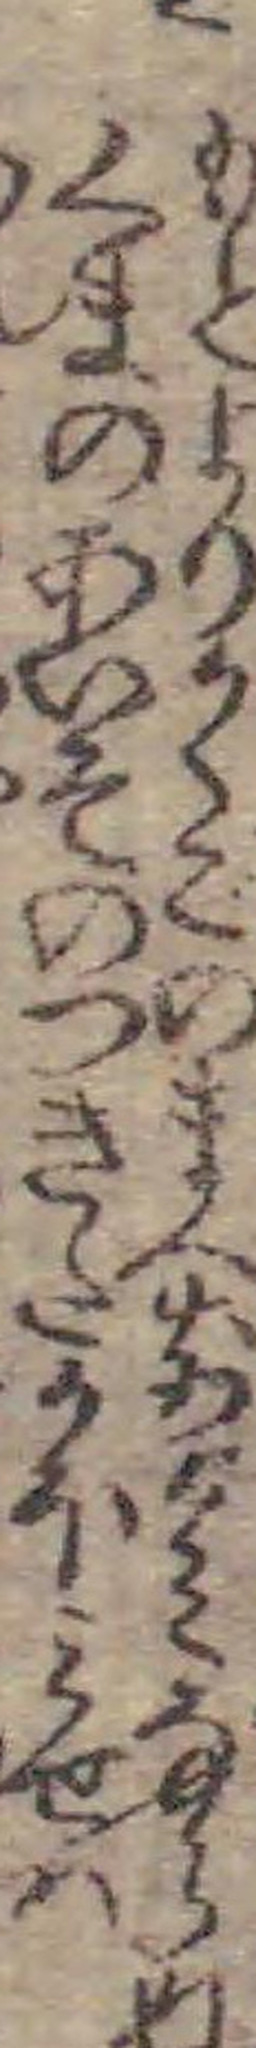くまのあいそのつきたかほみせは
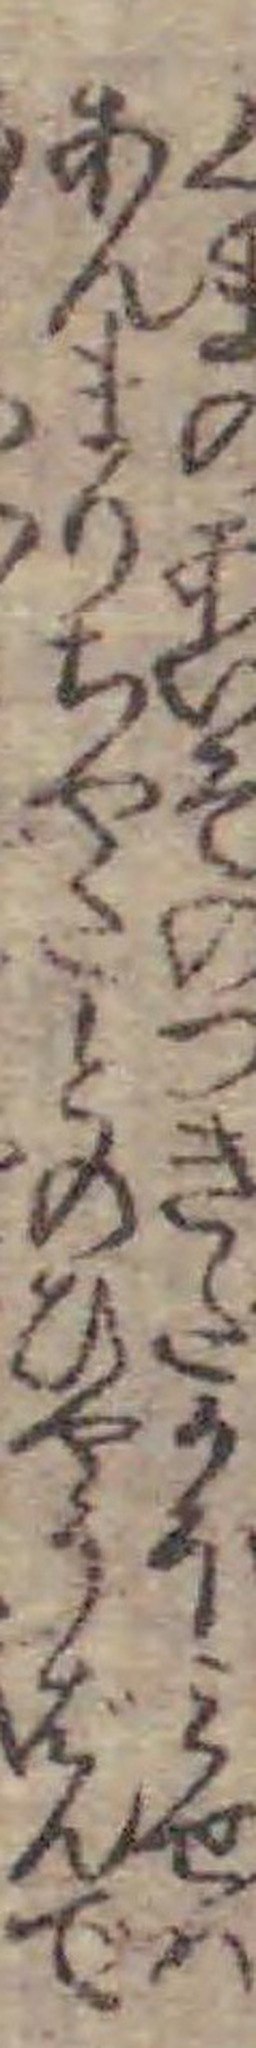あんまりちやたとのひやうばんで
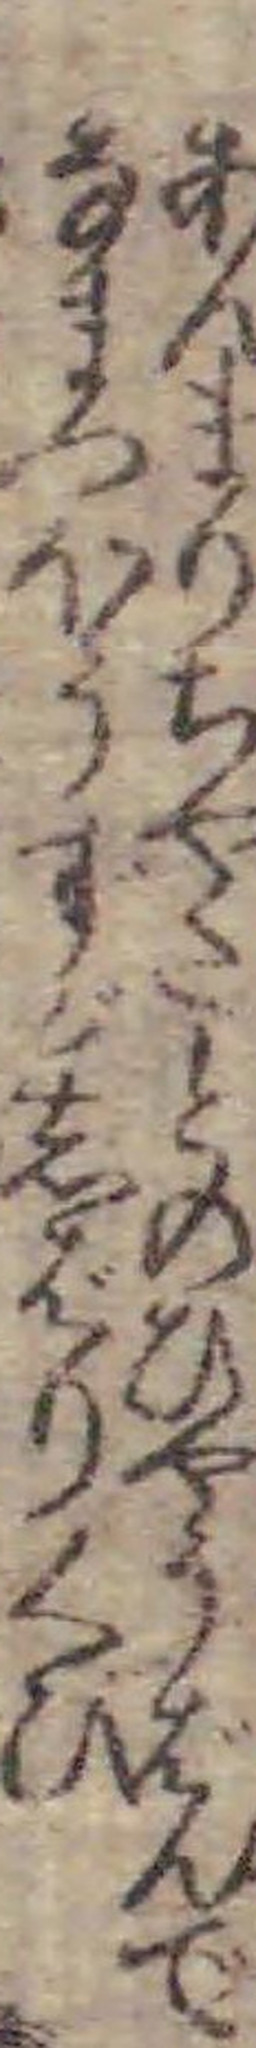なまつほうずがしばりくび
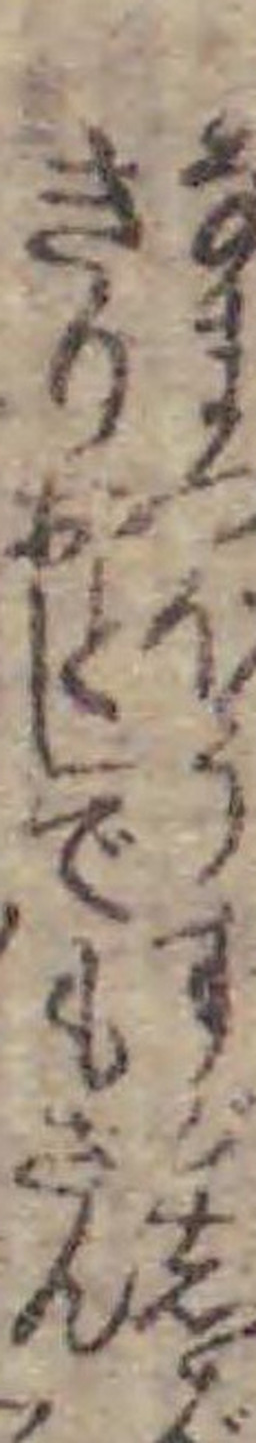きりおとしでもさん
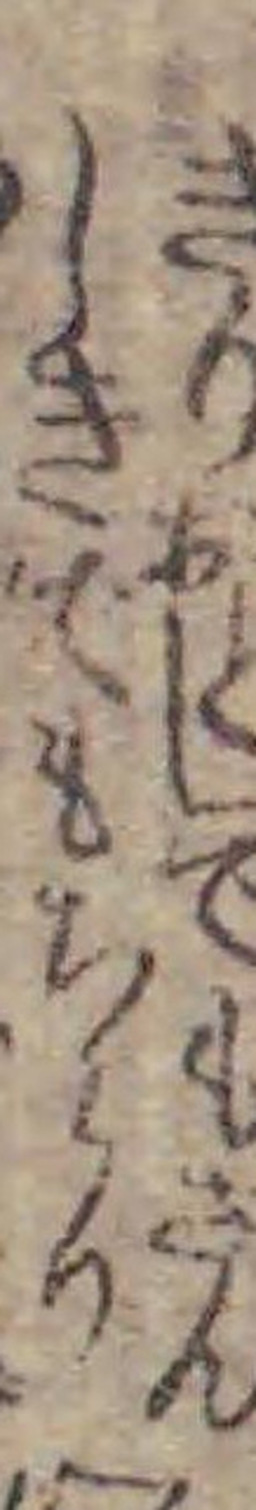しきでもちらり
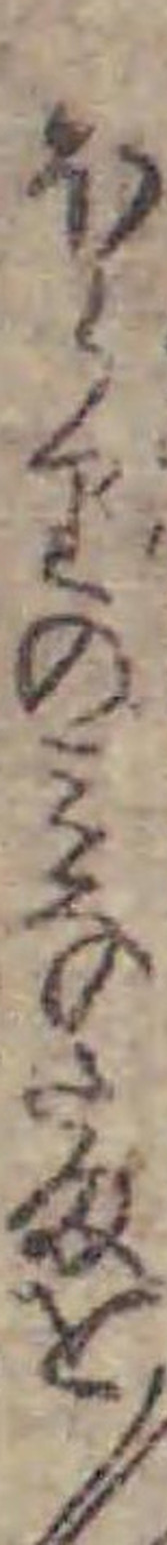ほらりのみなさまを
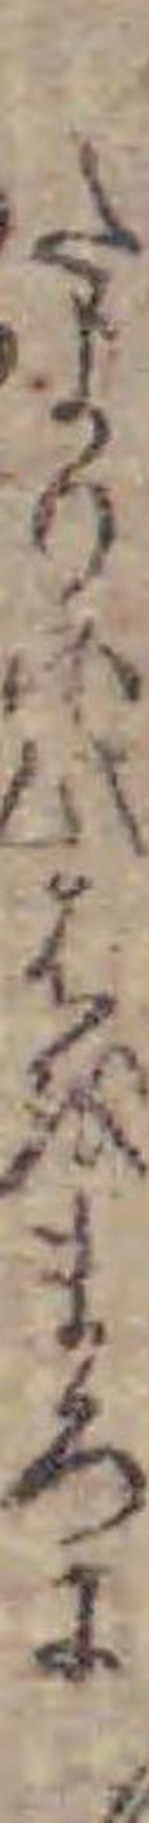さよりに此はをまろに
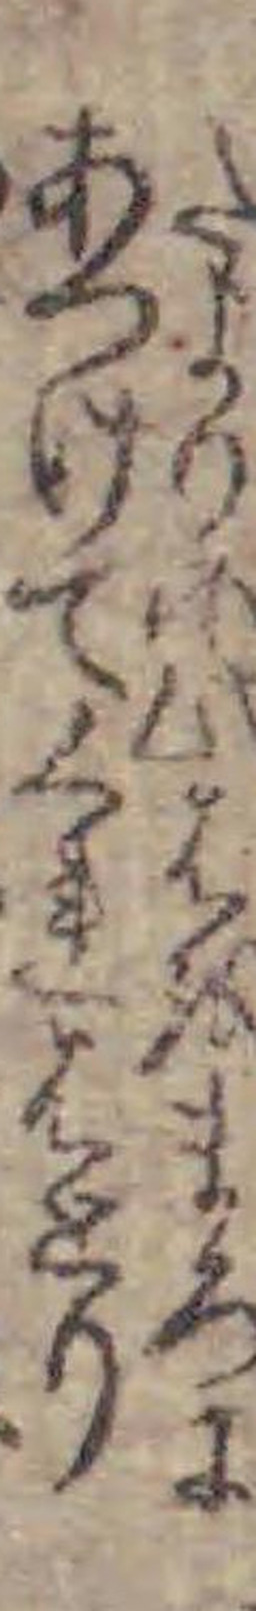あつけてくれはとり
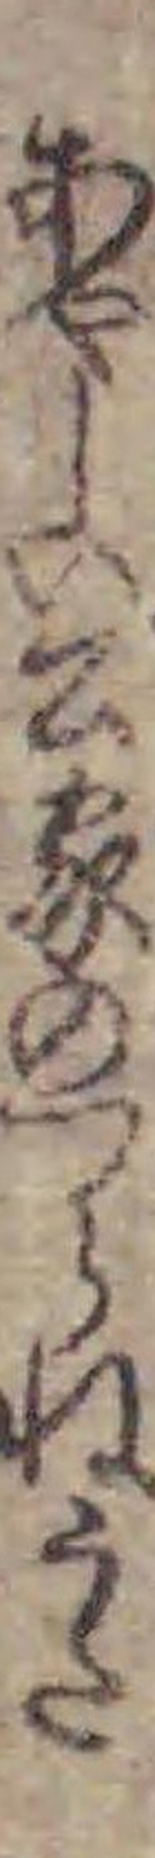あやしい公家のつらねかた
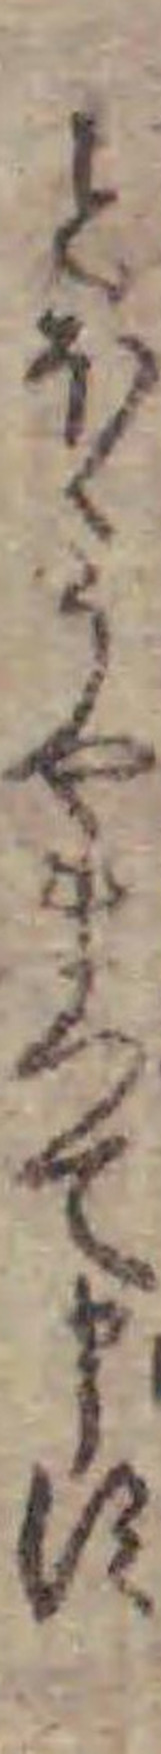とほくうやまつて申す
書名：本樹真猿浮気噺 : 3巻
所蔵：国立国会図書館 National Diet Library, JAPAN
